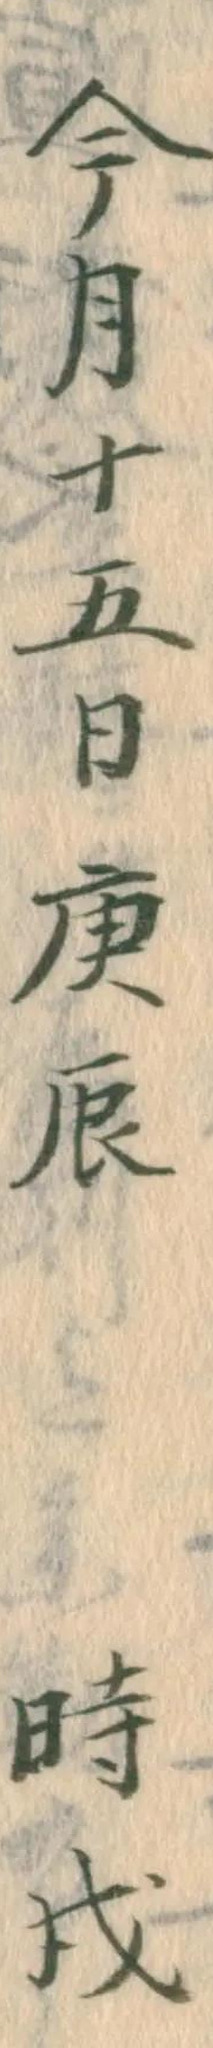今月十五日庚辰時戊
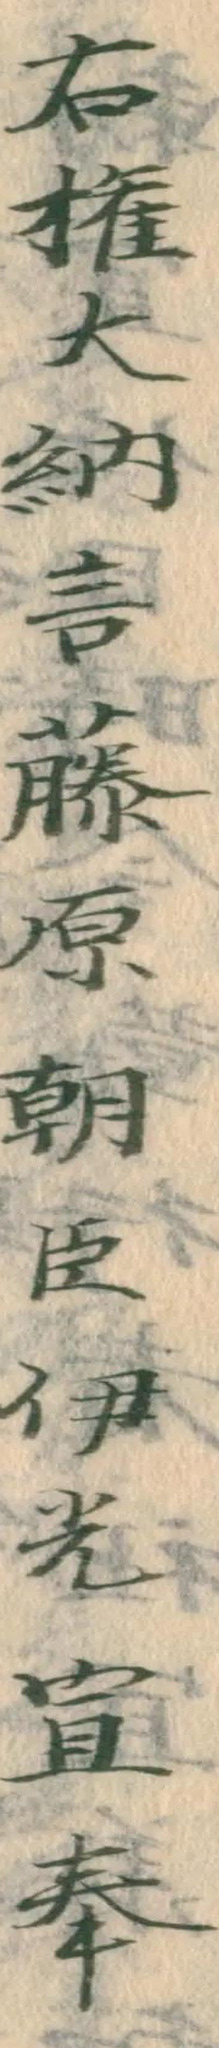右権大納言藤原朝臣伊光宣奉
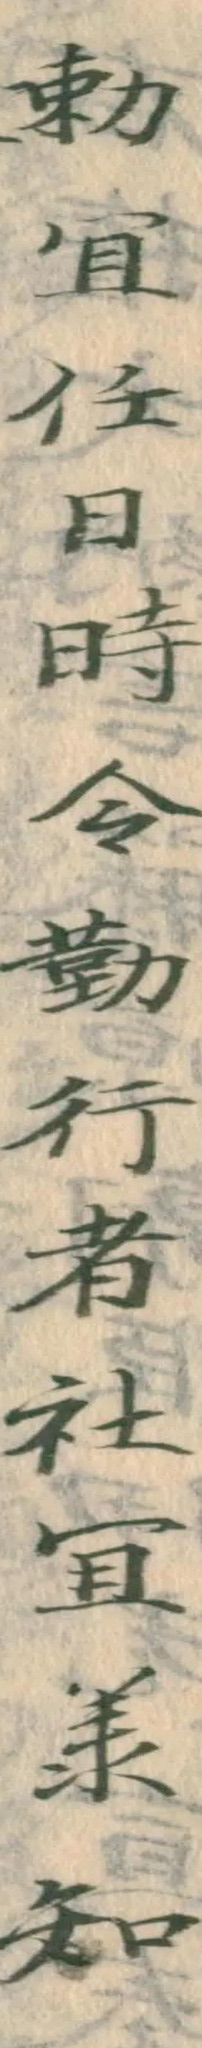勅宜任日時令勤行は社宜承知
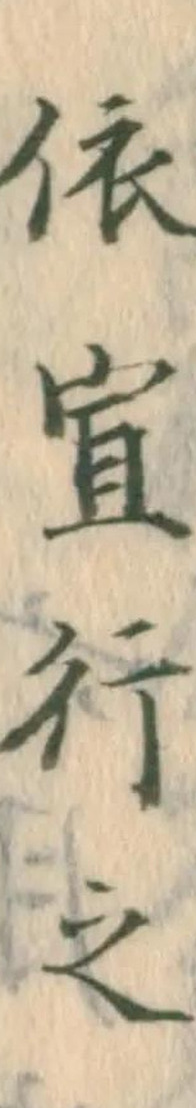依宣行之
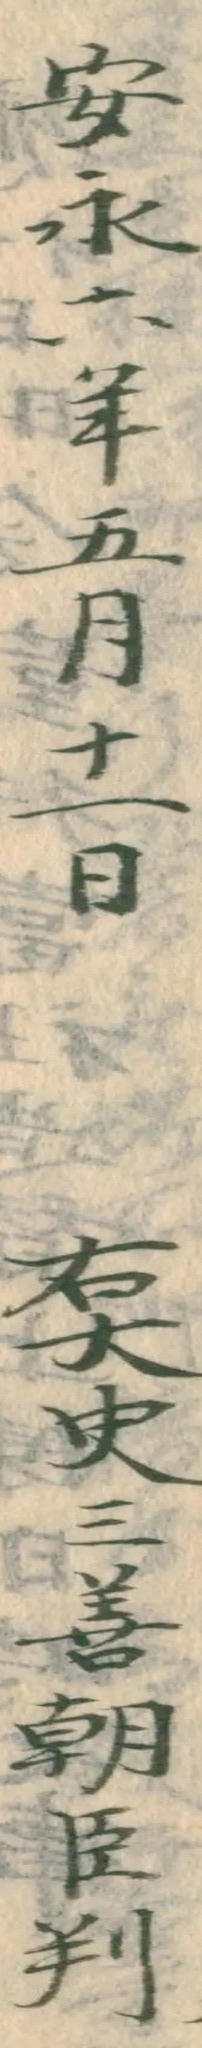安永六年五月十一日右大史三善朝臣判
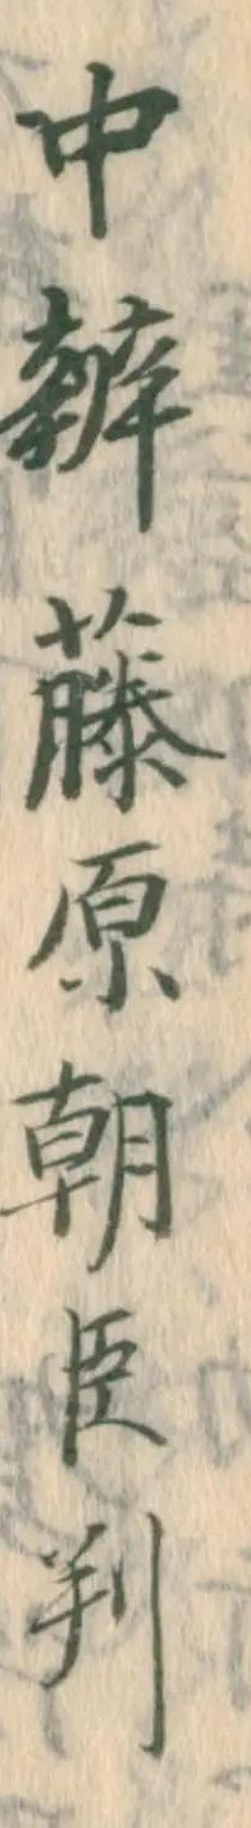中弁藤原朝臣判
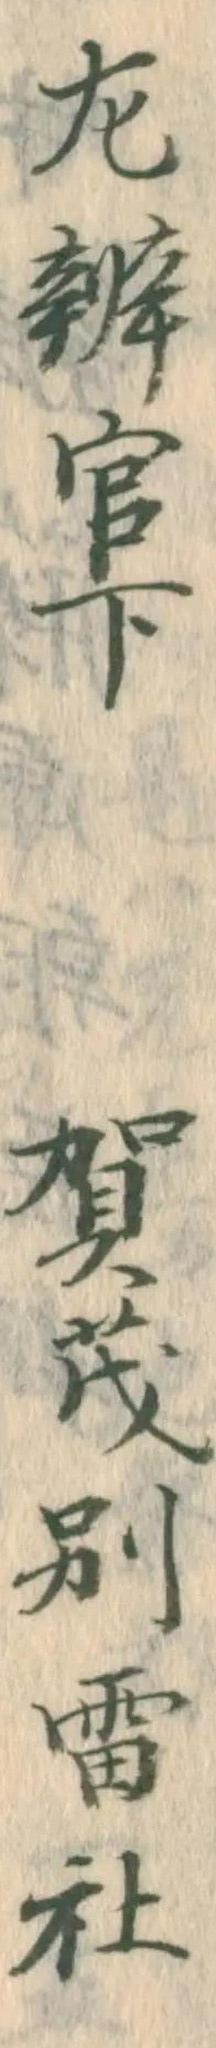左弁官下賀茂別雷社
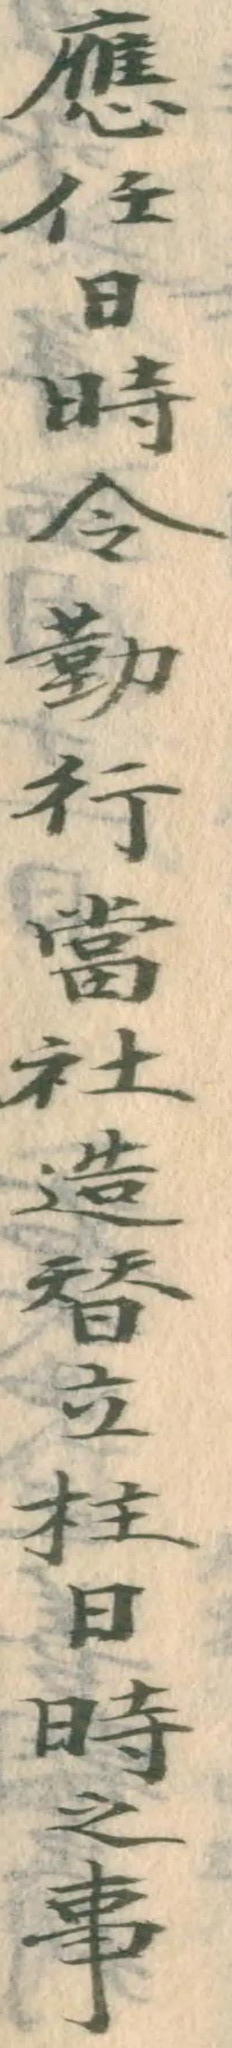応任日時令勤行当社造替立柱日時之事
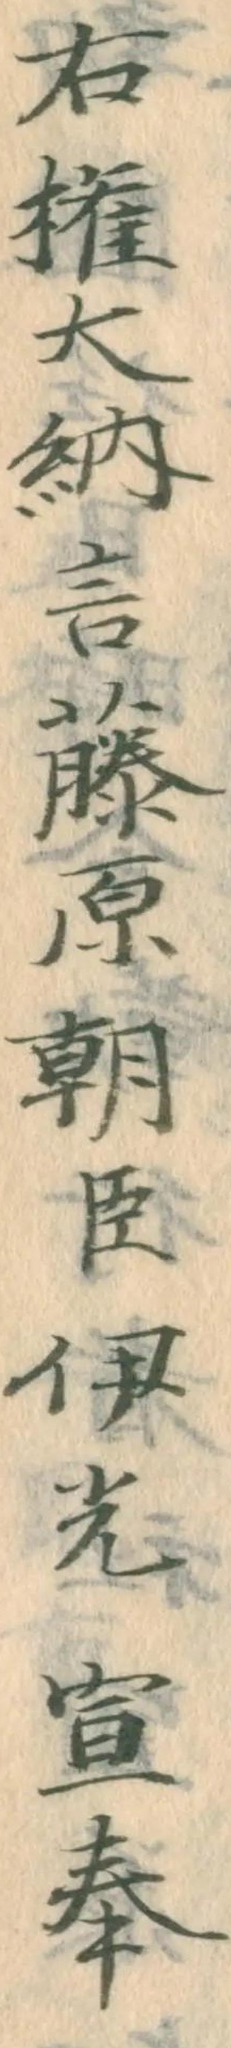右権大納言藤原朝臣伊光宣奉

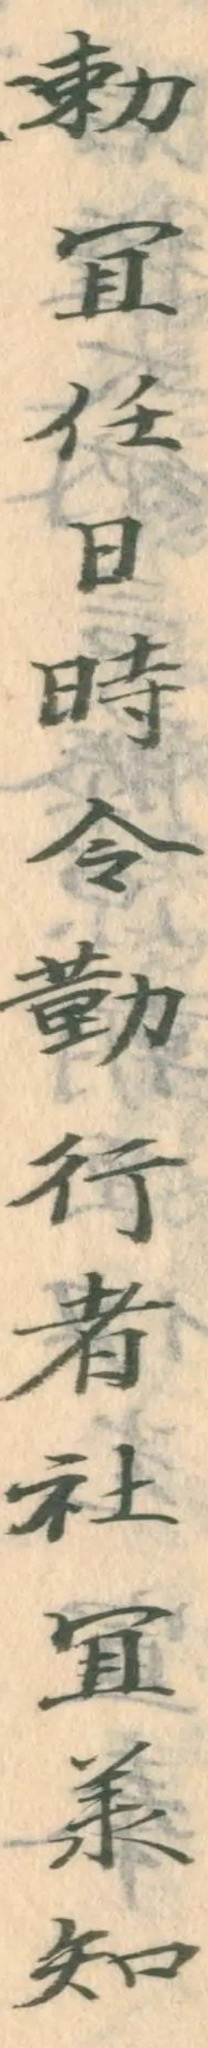勅宜任日時令勤行は社宜承知
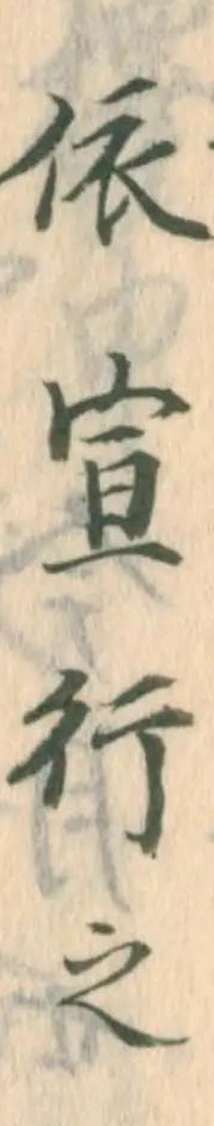依宣行之
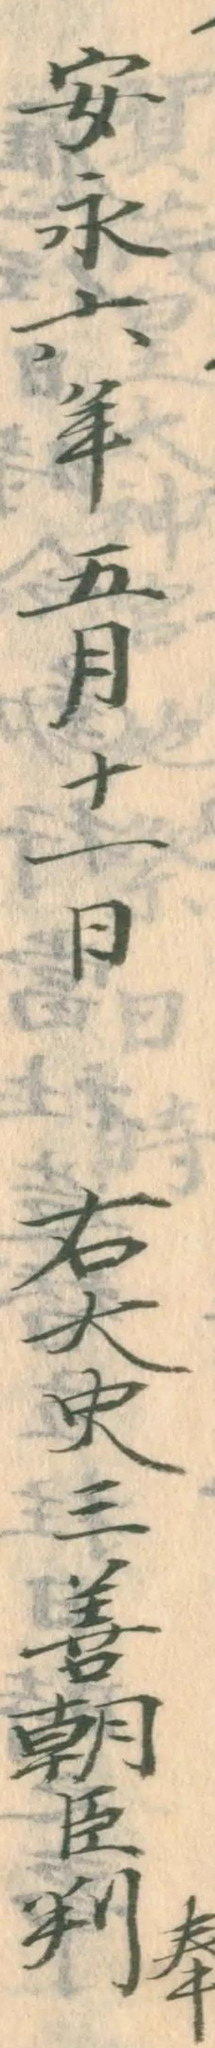安永六年五月十一日右大史三善朝臣判
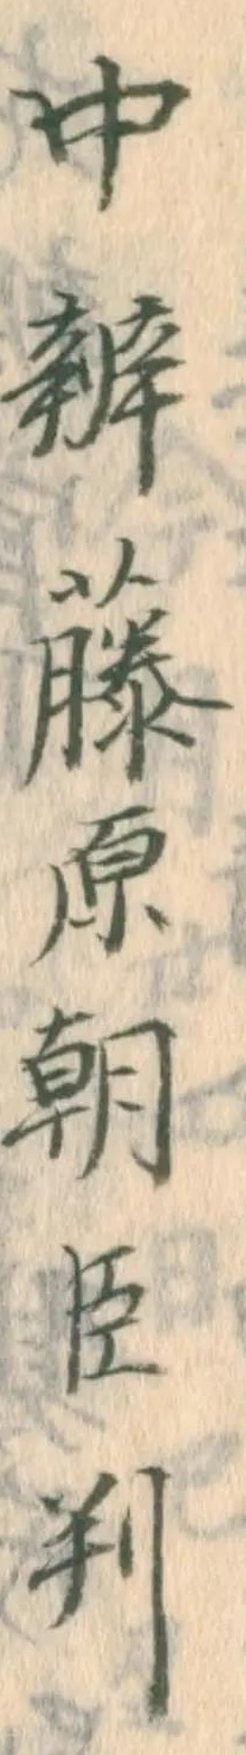中弁藤原朝臣判
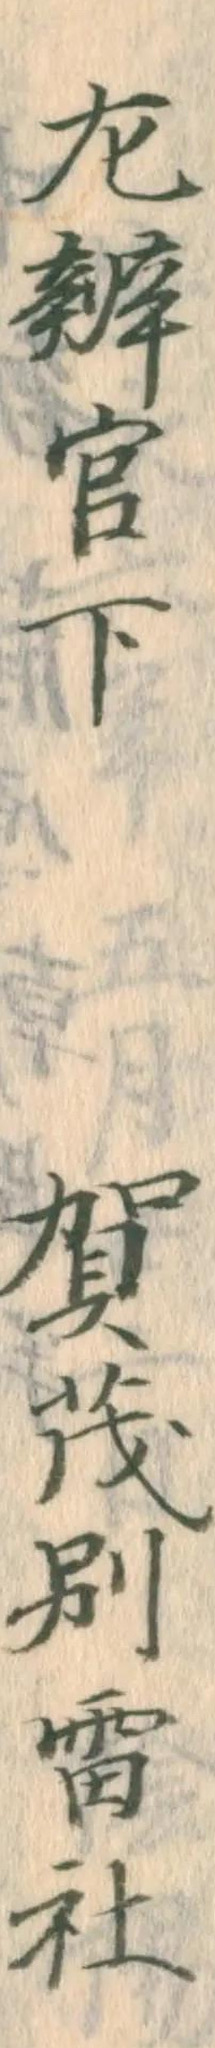左弁官下賀茂別雷社
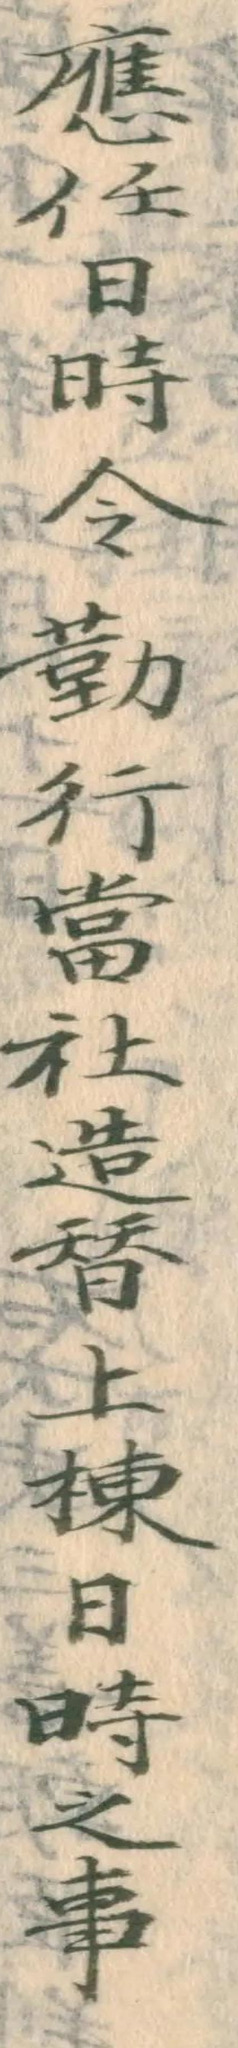応任日時令勤行当社造替上棟日時之事
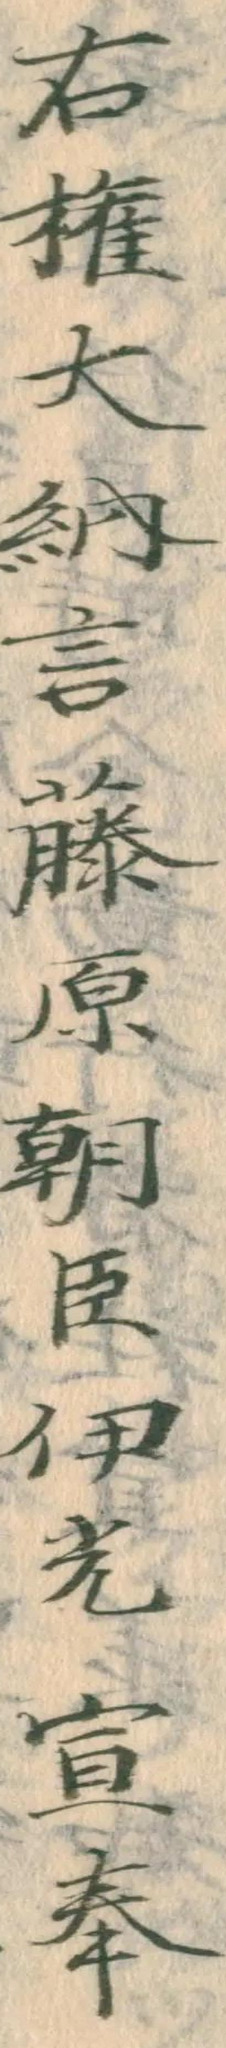右権大納言藤原朝臣伊光宣奉
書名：賀茂社記録. 第17冊
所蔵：国立国会図書館 National Diet Library, JAPAN
